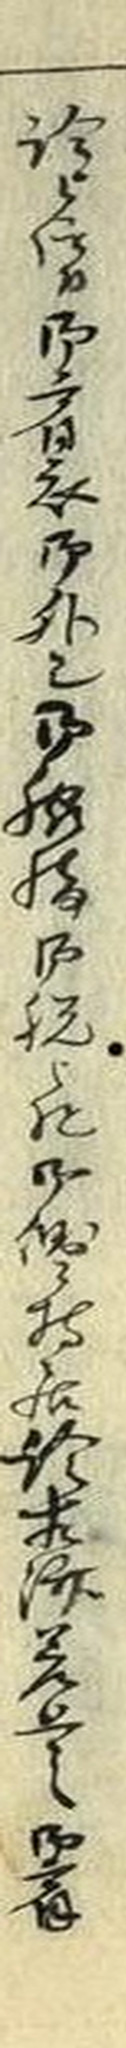診被仰付御肩衣御外シ御脇指御脱被遊御側ニ持居診相済差上之御肩
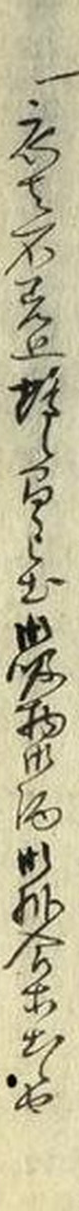衣者不差上鶴之間へ被出御吸物御酒御掛合等出候由
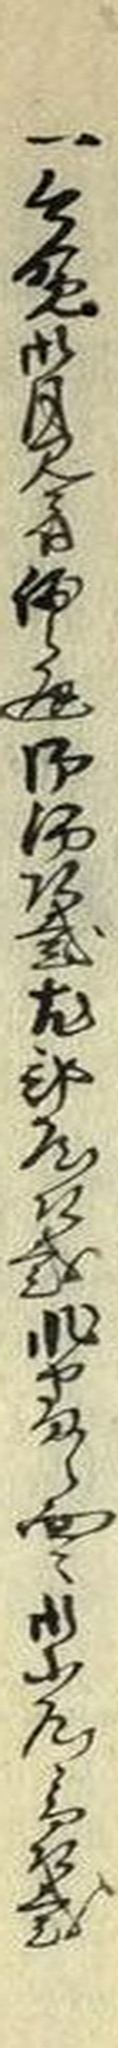一今晩御月見ニ付例之通御酒頂戴尤部屋頂戴非番之面々御小屋ニ而頂戴
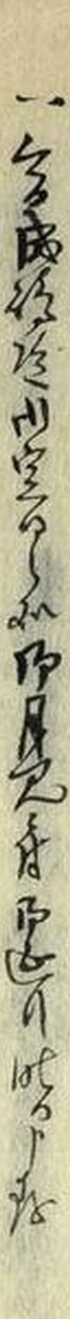一今日成嶋殿御定日之処御月見ニ付御延引昨日申越
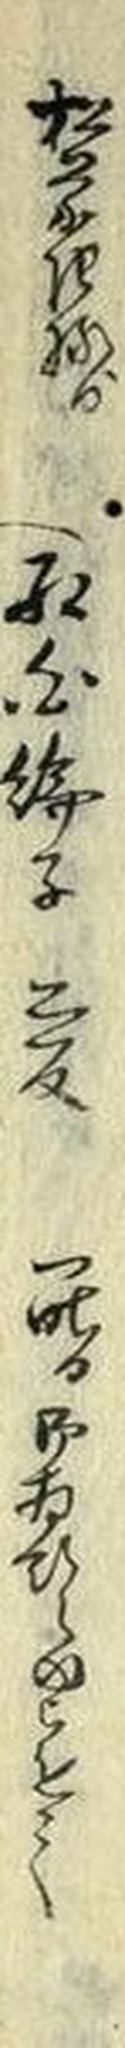松栄院様ゟ紅白綸子二反一昨日御拝領之由被進之
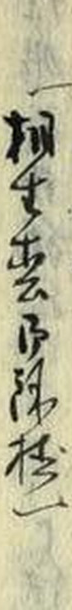相生松御鉢植一
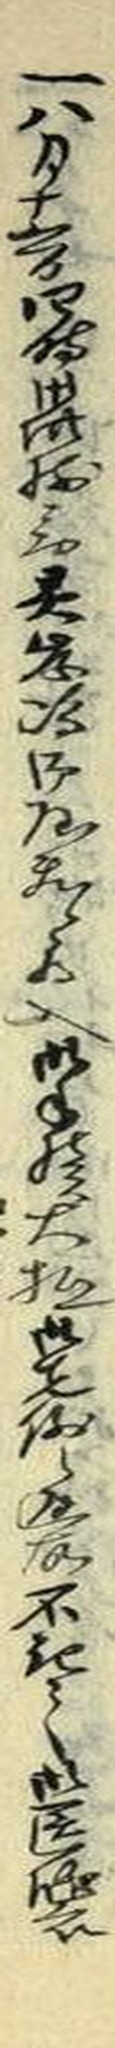一八月十六日四時御供揃ニ而霊厳嶋御屋敷へ被為入御手続大極御先例之通故不記之御医師衆
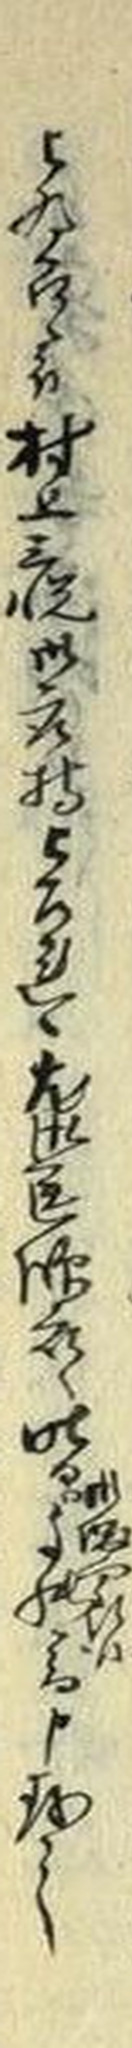被為召候ニ付村上三悦御取持被召連候尤御医師衆へ昨日御側向頭取手紙ニ而申越之
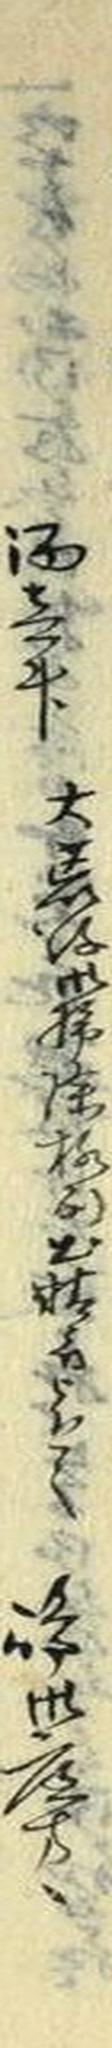酒壱升大荒後御掃除格別出精ニ付被下之嶋御庭方へ
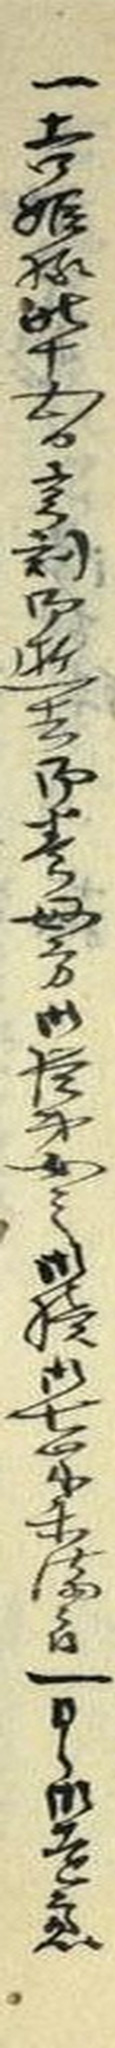一吉姫様昨十五日亥刻御逝去御養母方御従弟女之御続御七歳未満ニ付一日之御遠慮
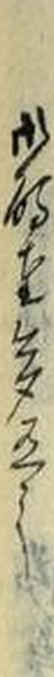御触達今夕有之
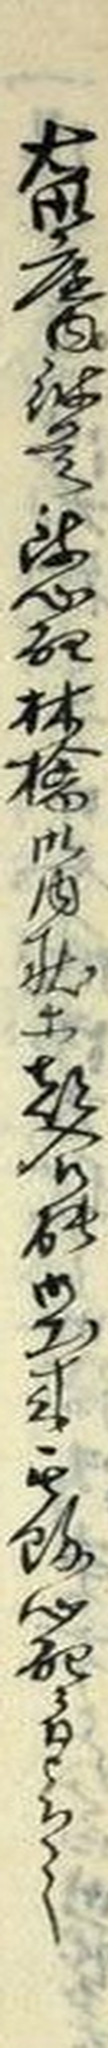右御庭内彼是致心配林檎御内献等都合能御出来其余心配ニ付被下之
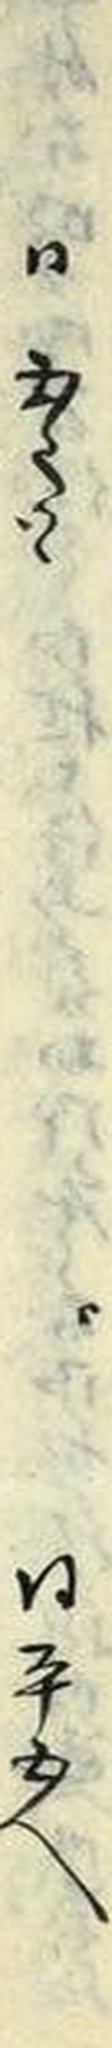同五匁ツヽ同同平五人
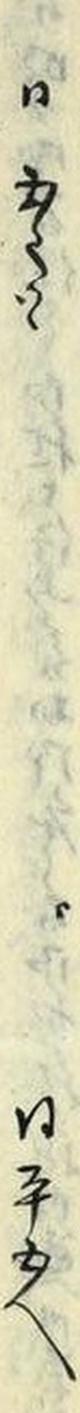同五匁ツヽ同同平五人
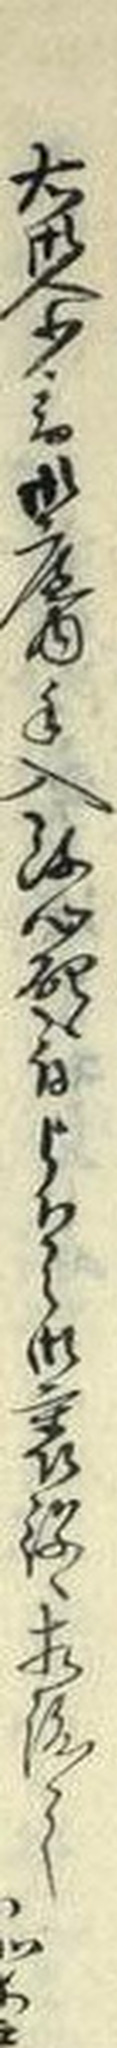右御人少ニ而御庭内手入致心配候ニ付被下之御裏役へ相渡之
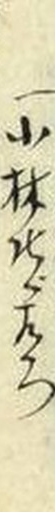小林次郎左衛門
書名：少傅日録抄（斉善付側向頭取日記、在府）
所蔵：福井県文書館 Fukui Prefectural Archives
